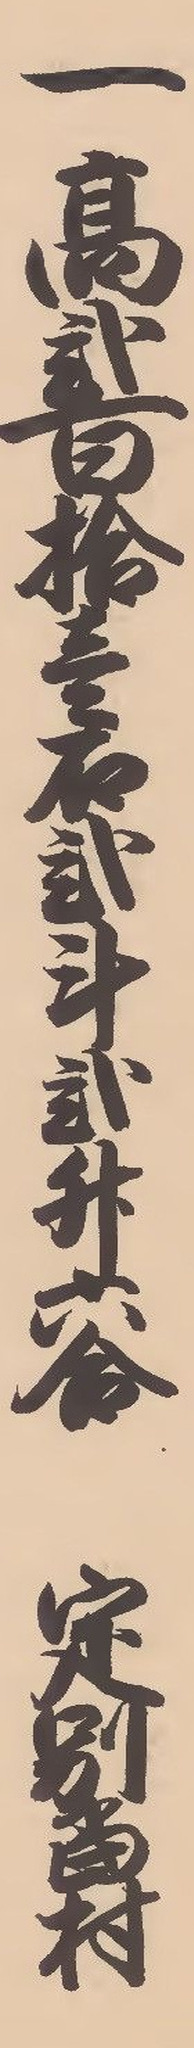一髙弐百拾壱石弐斗弐升六合定別当村
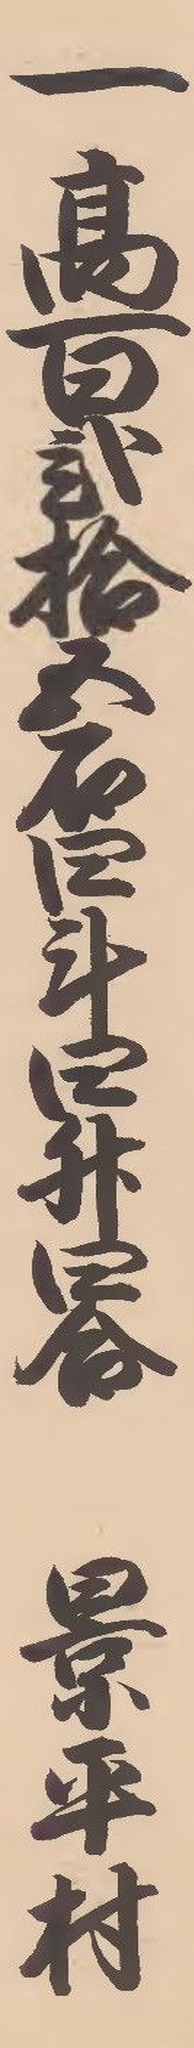一髙百弐拾五石四斗四升四合景平村
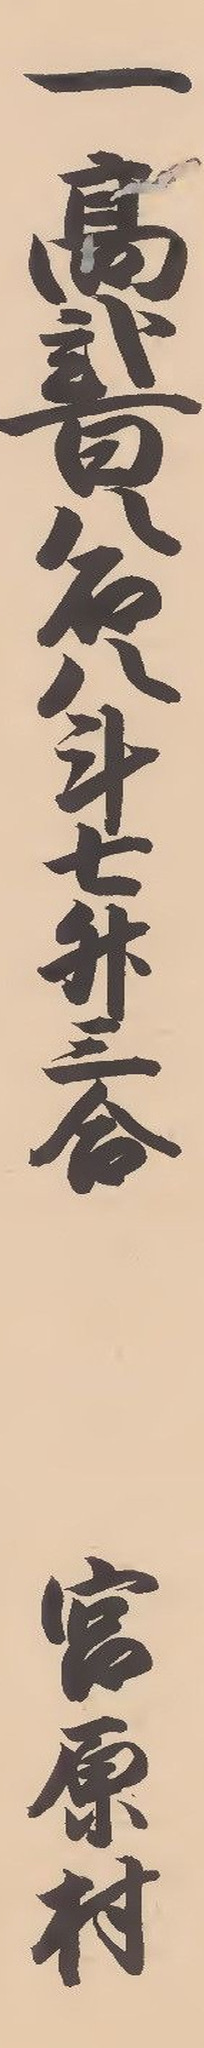一髙弐百八石八斗七升三合宮原村
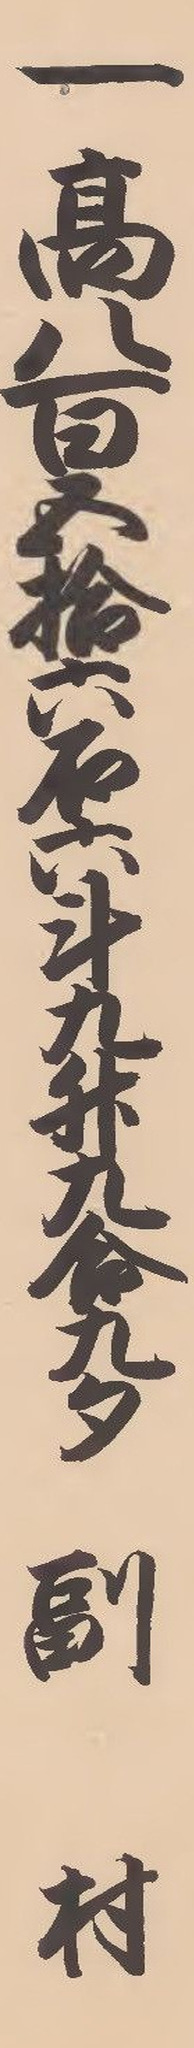一髙八百五拾六石六斗九升九合九夕副村
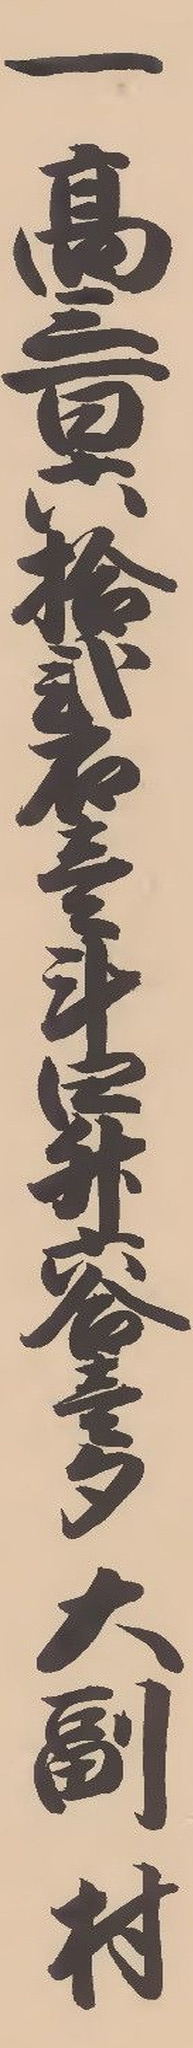一髙三百六拾弐石壱斗四升六合壱夕大副村
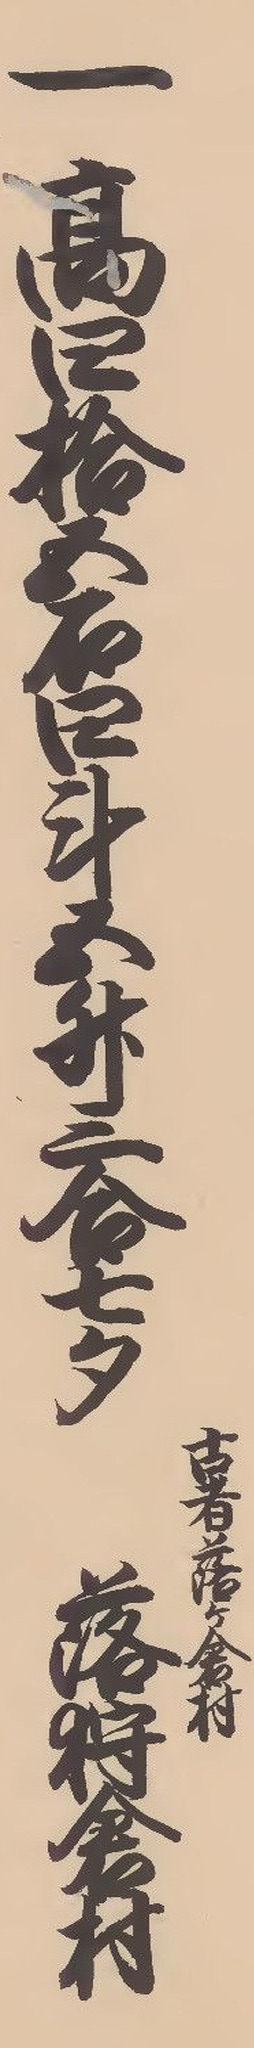一髙四拾五石四斗五升三合七夕落狩倉村
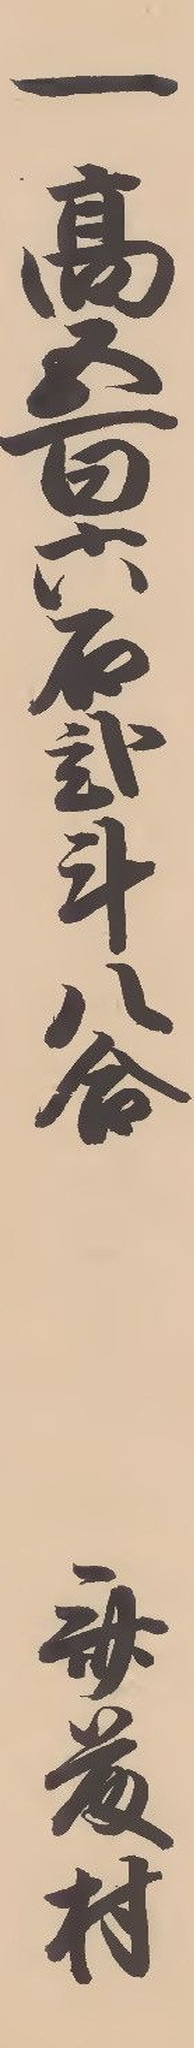一髙五百六石弐斗八合齋藤村
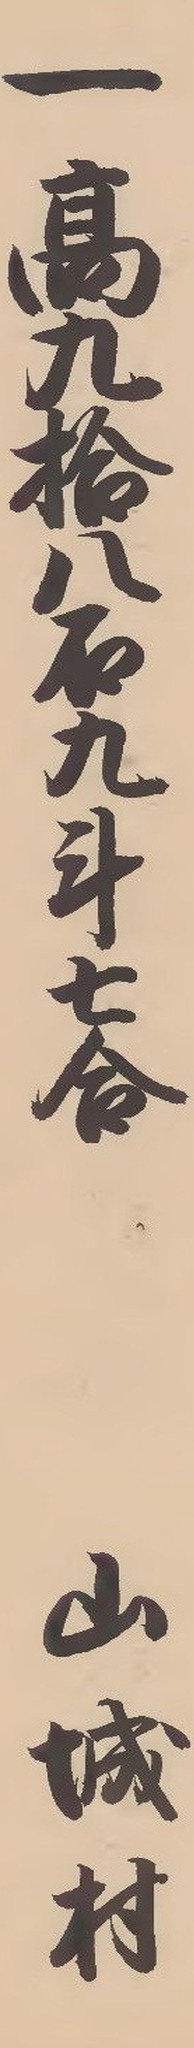一髙九拾八石九斗七合山城村

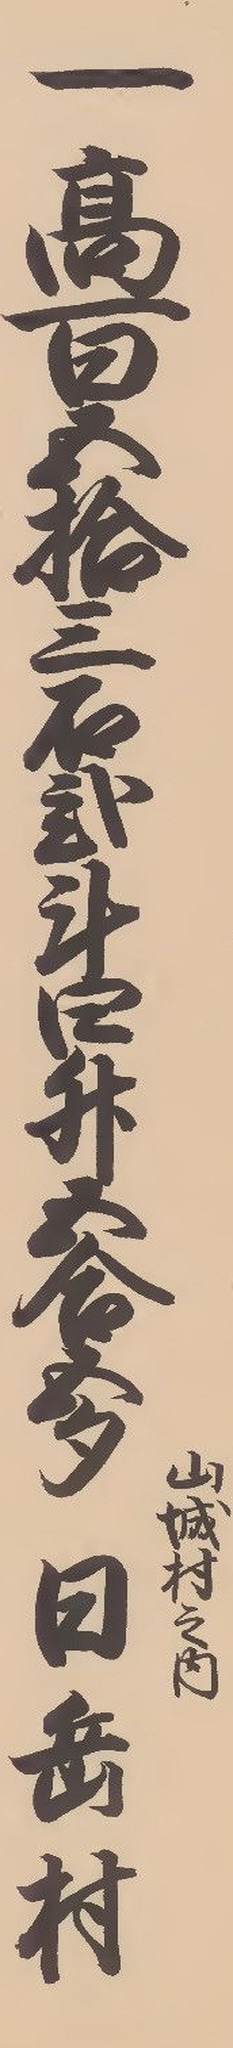一髙百五拾三石弐斗四升五合五夕日岳村
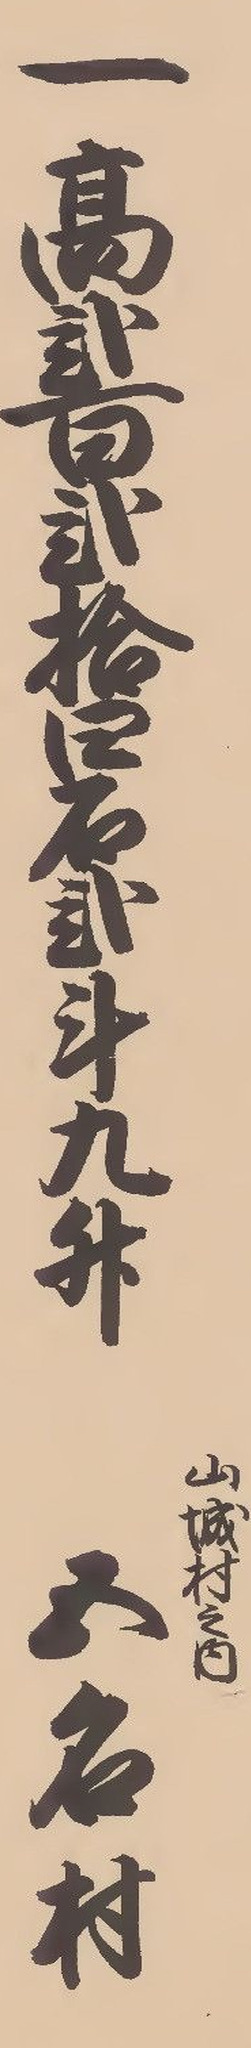一髙弐百弐拾四石弐斗九升五名村
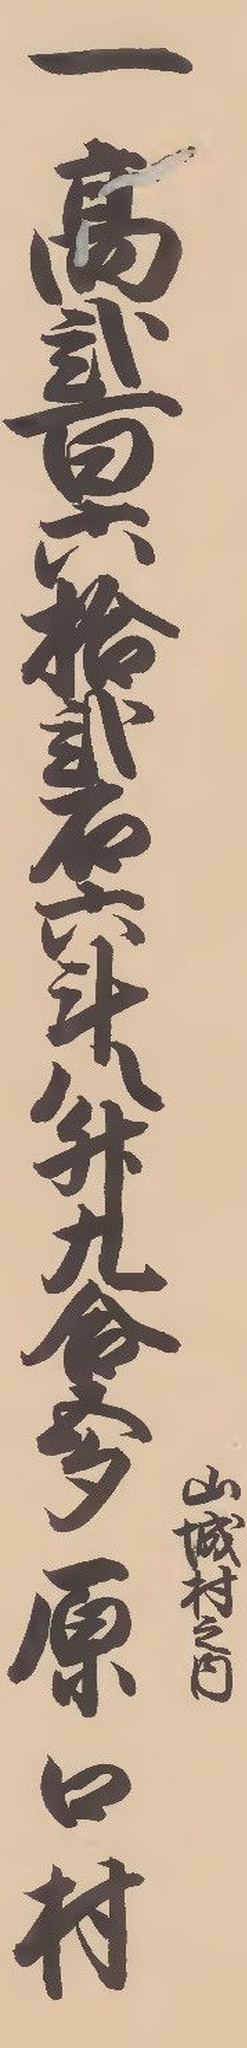一髙弐百六拾弐石六斗八升九合五夕原口村
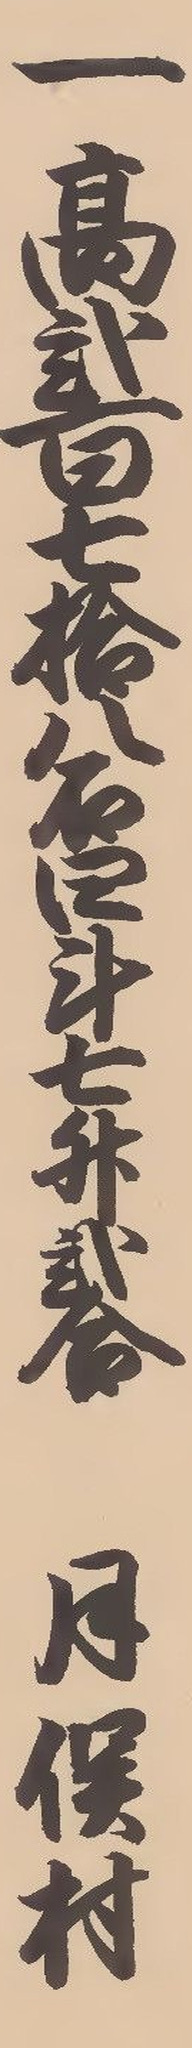一髙弐百七拾八石四斗七升弐合月俣村
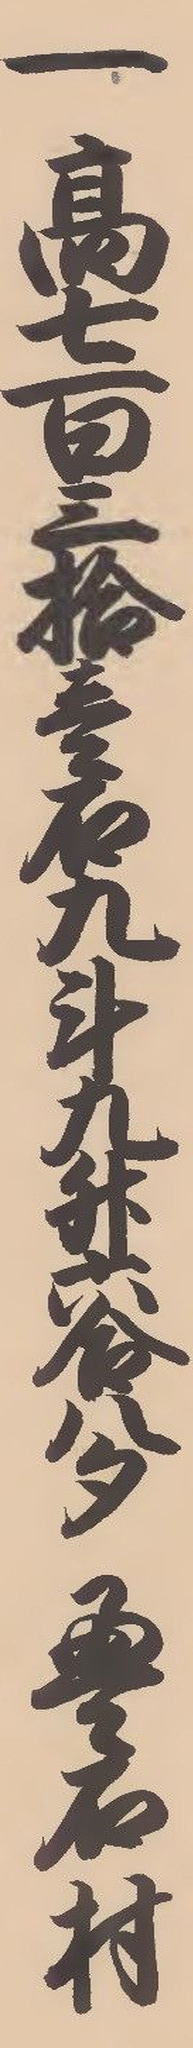一髙七百三拾壱石九斗九升六合八夕疊石村
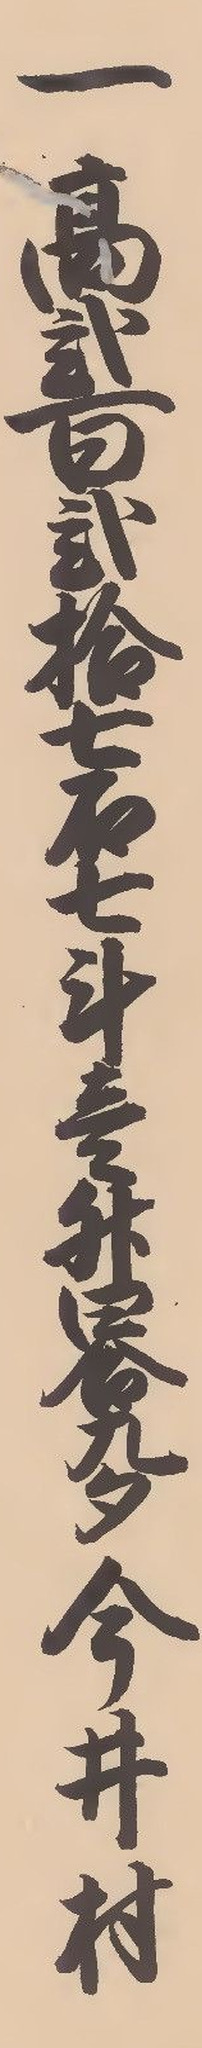一髙弐百弐拾七石七斗壱升四合九夕今井村
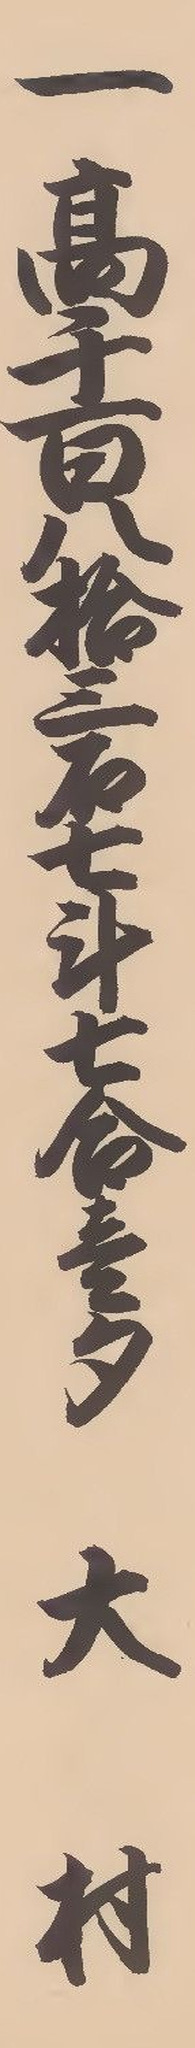一髙千百八拾三石七斗七合壱夕大村
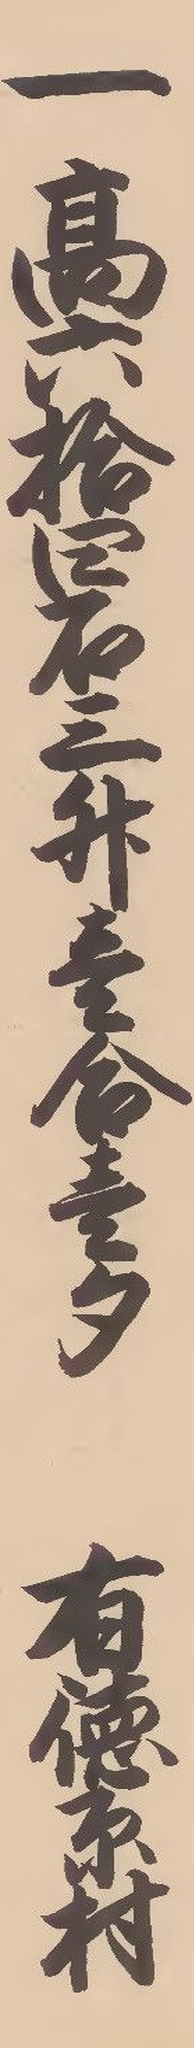一高六拾四石三升壱合壱夕有徳原村
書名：豊前国郷帳
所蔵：国立公文書館 National Archives of Japan
